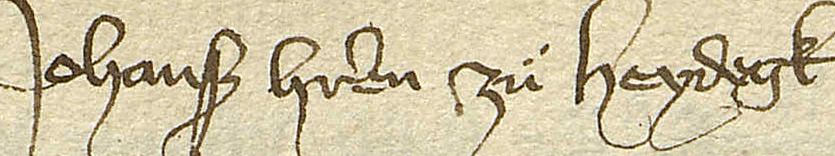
Iohanſ* hr*en cʒü heydegk
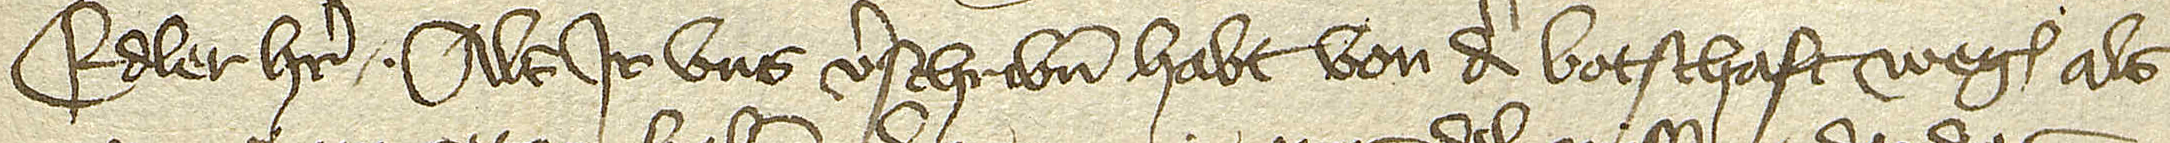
Edler hr* / . Als Ir vns v*ſchribn* habt von d* botſchaft weg* als
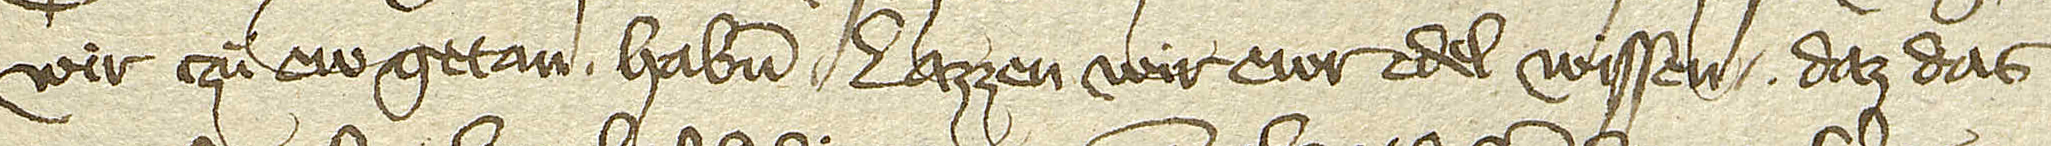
wir cʒü ew getan . habn* / Laʒʒen wir ewr edel wiſſen / . daʒ das
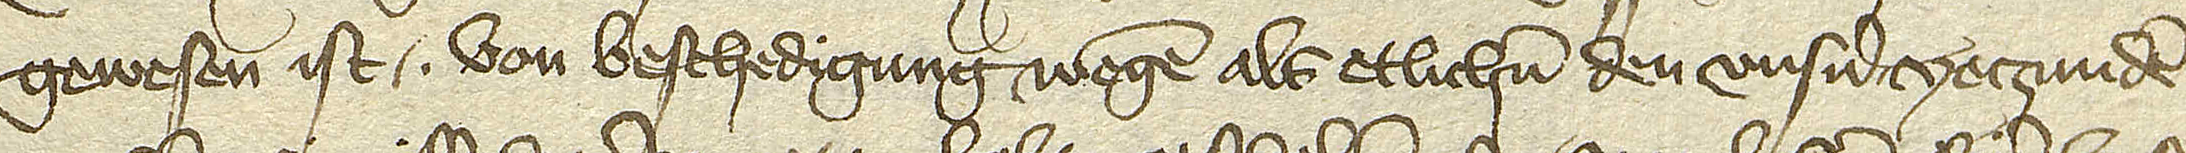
geweſen iſt / . von beſchedigung wege* als etlichn* den vnſn* / yecʒund*
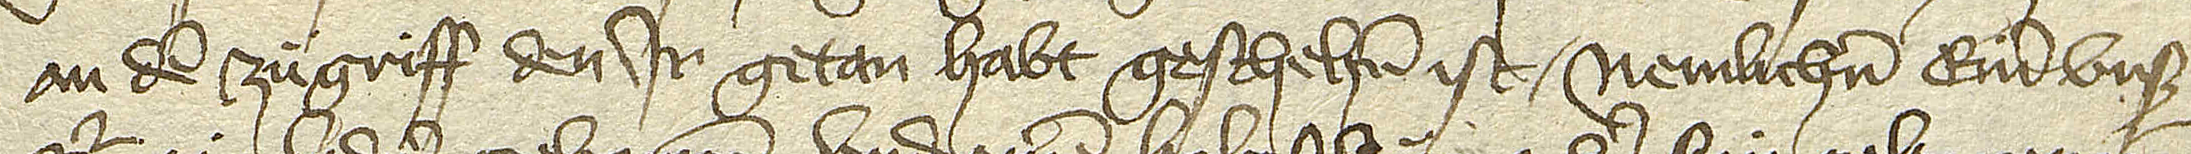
an d* cʒügriff den Ir getan habt geſchehn* iſt / Nemlichn* Ein* vnſ*
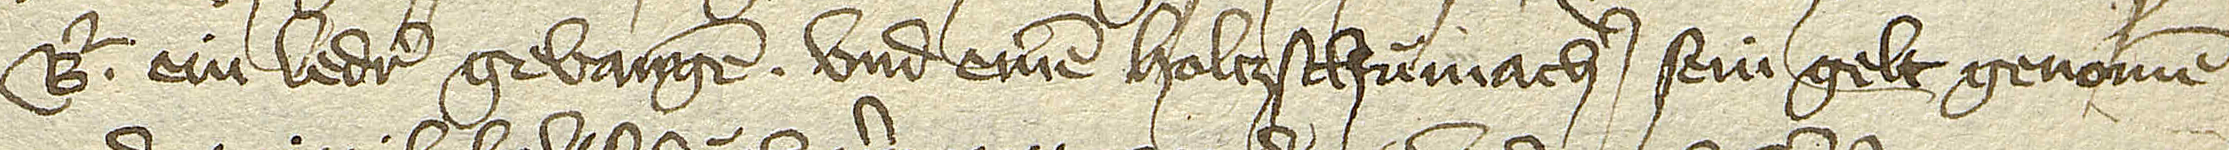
B* . ein ledr* gevange* . vnd eine* holcʒſchümach* ſein gelt genome*
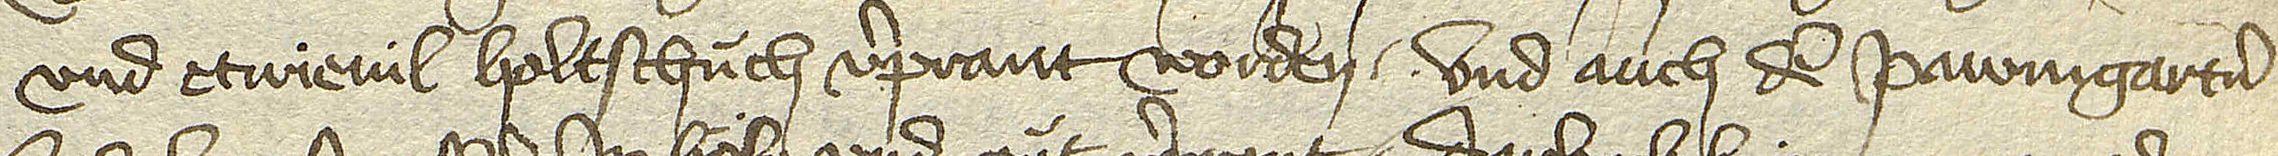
vnd etwieuil holtſchüch v*prant worden / . vnd auch d* pawmgartn*
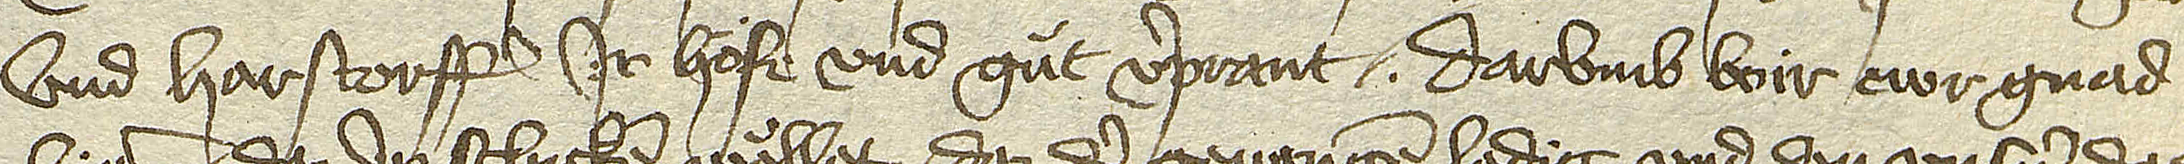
vnd harſtorff* Ir höfe vnd güt v*prant / . Darvmb wir ewr gnad
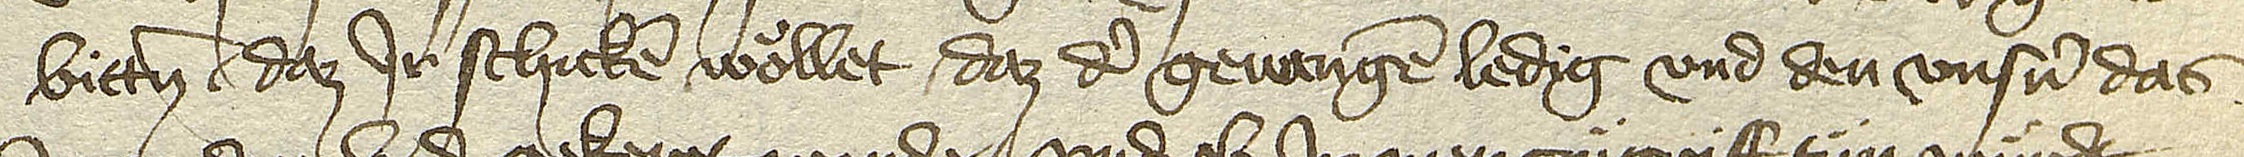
bittn* / daʒ Ir ſchicke* wöllet / daʒ d* gevange* ledig vnd den vnſn* das
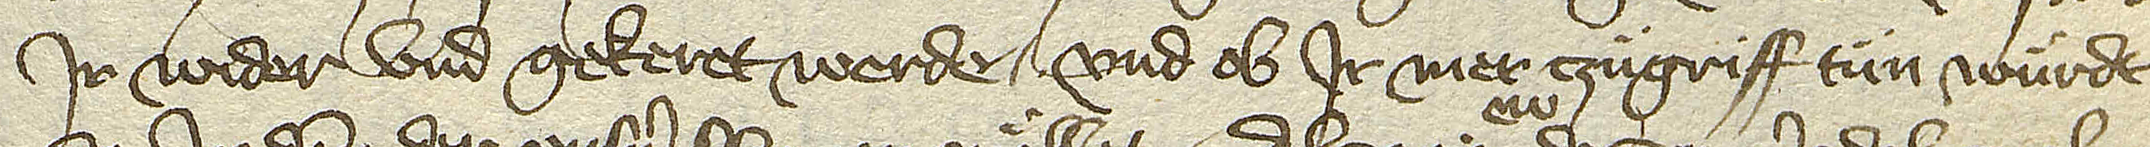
Ir wider vnd gekeret werde / vnd ob Ir mer cʒügriff tün würdt
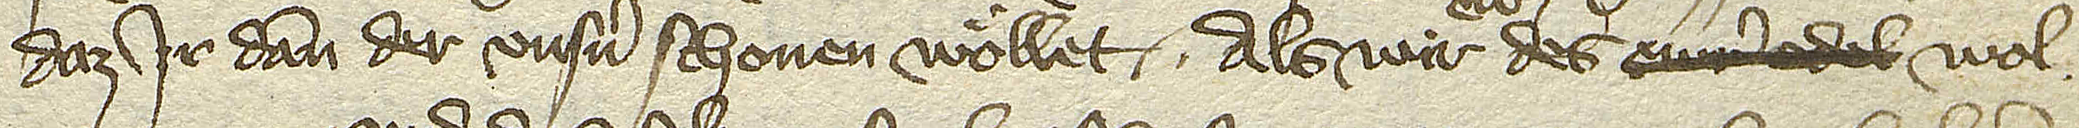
daʒ Ir dan* der vnſn* ſchonen wöllet / . Als wir des ewr* edel wol
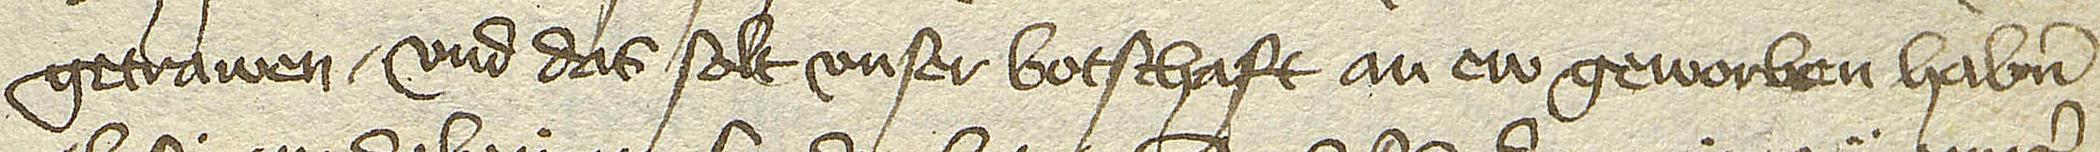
getrawen / vnd das ſolt vnſer botſchaft an ew geworben habn*
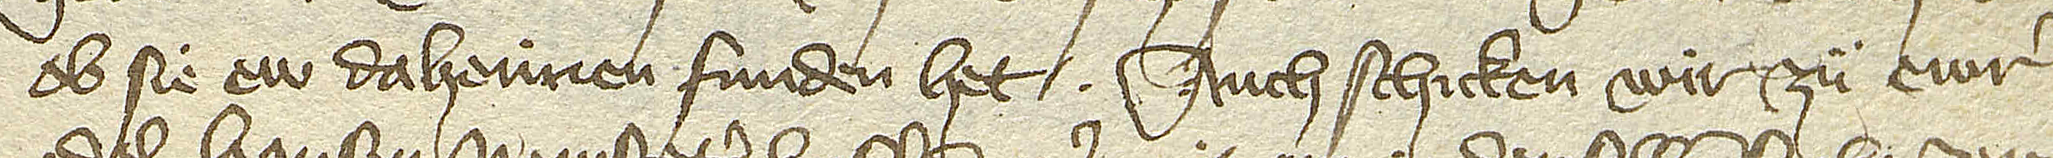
ob ſie ew daheimen funden het / . Auch ſchicken wie cʒü ewr*
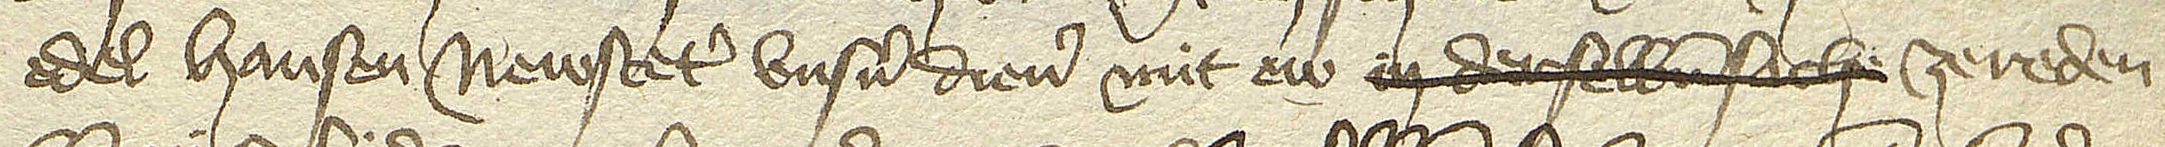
edel hanſen Newſtet* vnſn* dien* mit ew in derſelbn* ſache cʒe reden
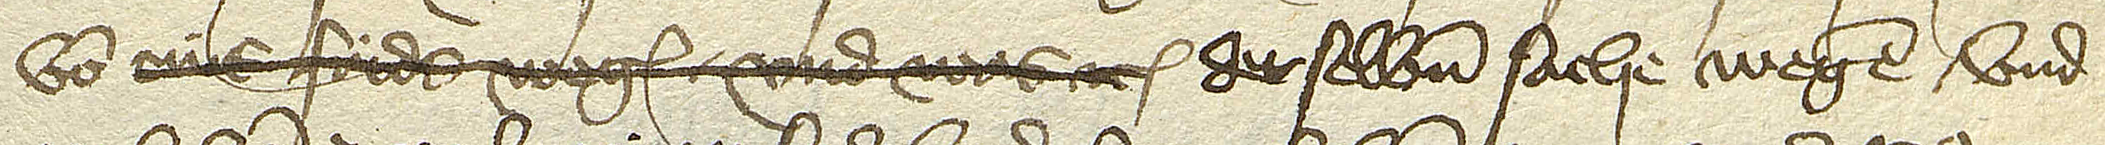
vo* eins frids* weg* / vnd was ec* derſelbn* ſache wege* / vnd
